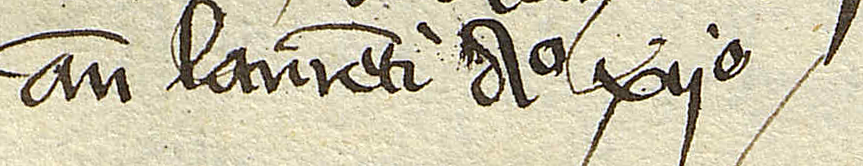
an* laureti* A* xii* /
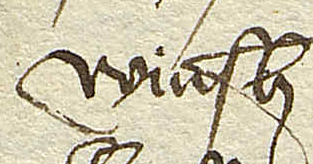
winſh*
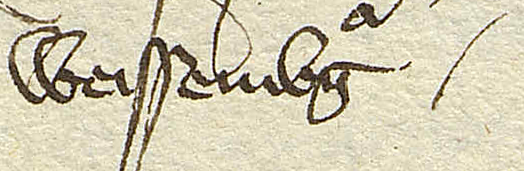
weiſſemb*g /
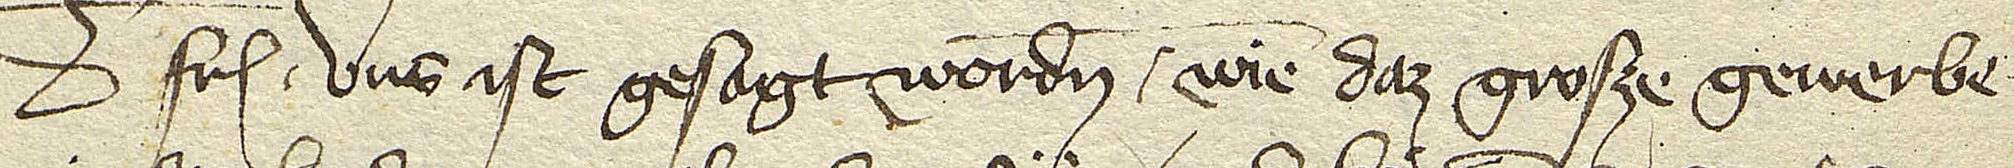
L* fr* / Vns iſt geſagt wordn* / wie daʒ groſʒe gewerbe
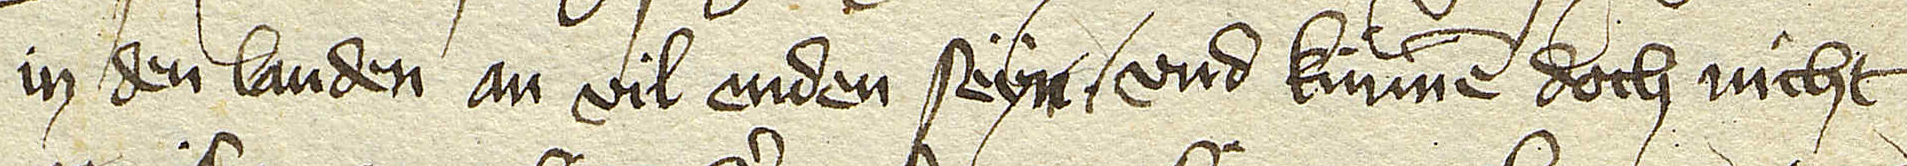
in den landen an vil enden ſeyn . / vnd künne* doch nicht
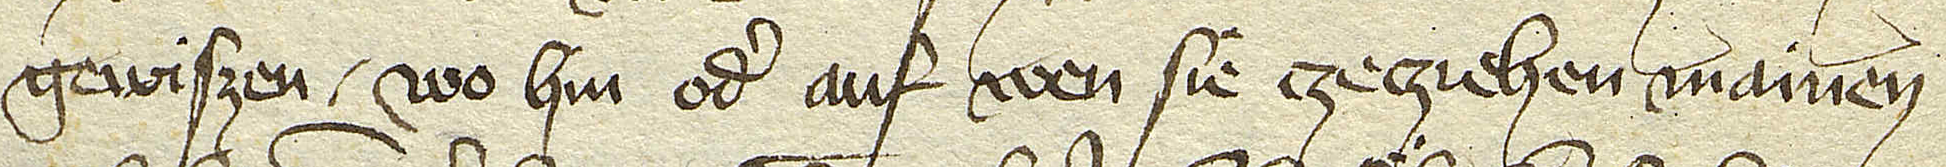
gewiſʒen / wo hin od* auf wen ſie cʒecʒiehen mainen
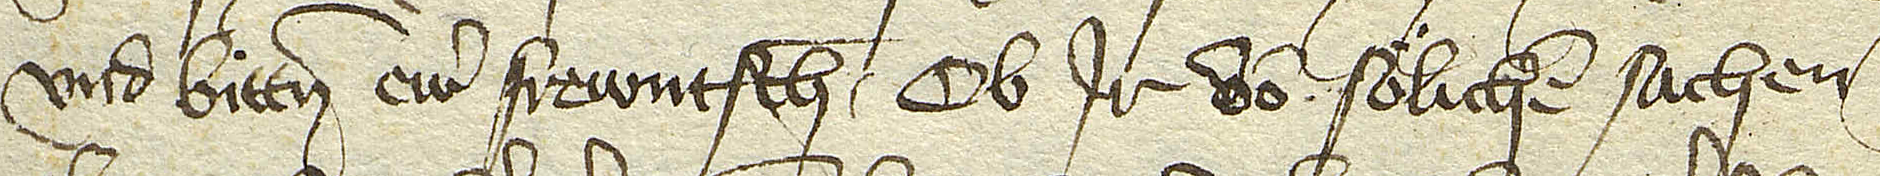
vnd bittn* ew* frewntſch* / Ob Ir vo* ſöliche* ſachen
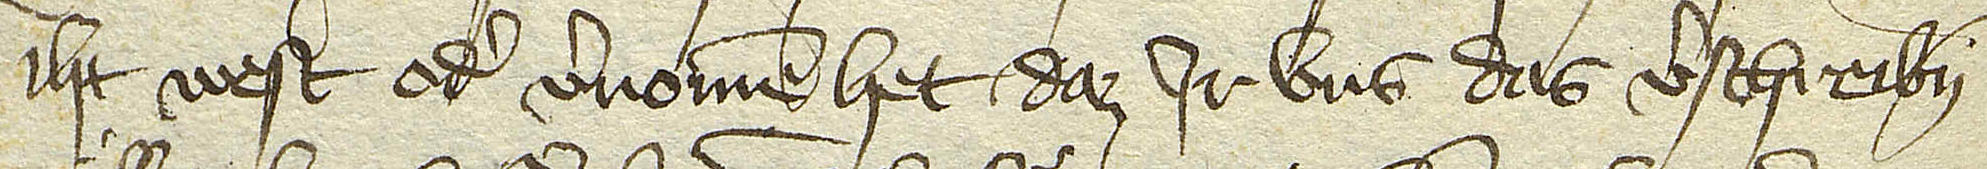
iht weſt od* v*nome* het / daʒ Ir vns das v*ſchreibn*
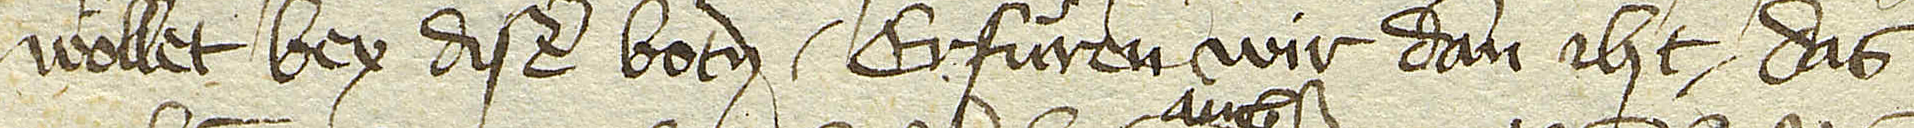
wöllet bey diſe* botn* / Erfüren wir dan* iht / das
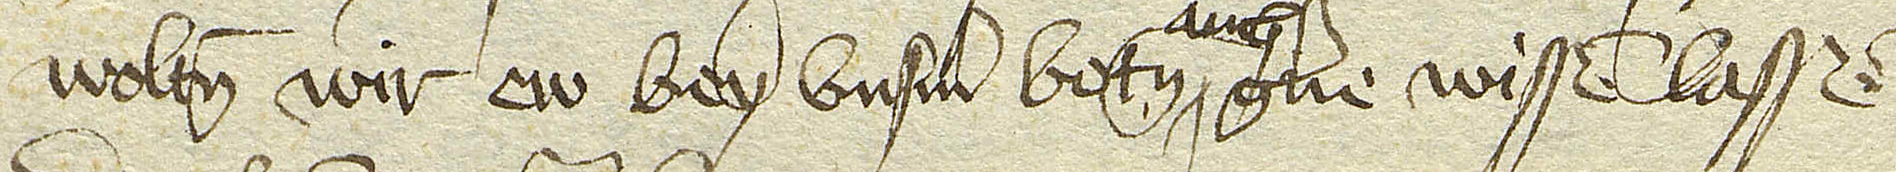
woltn* wir ew bey vnſm* botn* g*ne wiſſe* laſſe*
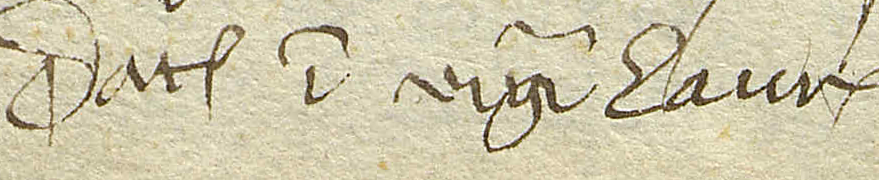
Dat* i* vigi* Laur*
